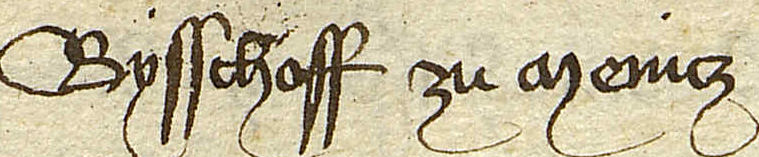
Byſſchoff cʒu Meincʒ
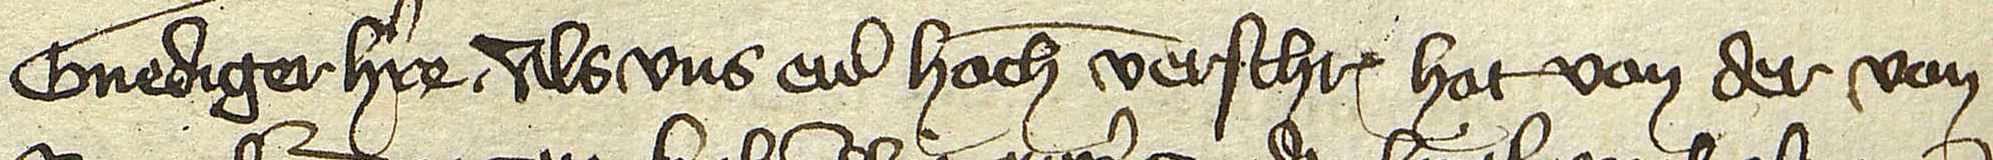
Gnediger h*re / Als vns ew* hoch* verſchr* hat von der von
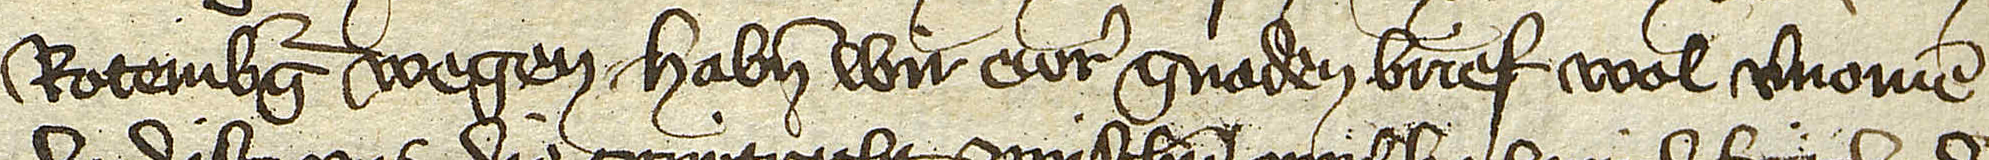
Rotemb*g wegen / habn* wir ewr* gnaden brief wol v*nome*
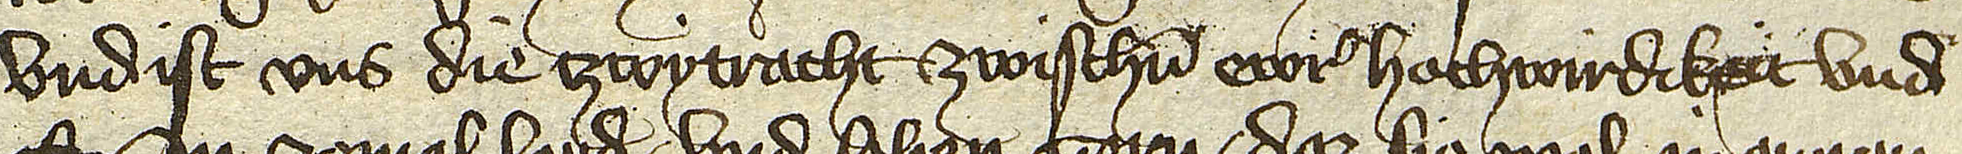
vnd iſt vns die cʒwytracht cʒwiſchn* ewr* hochwirdikeit vnd
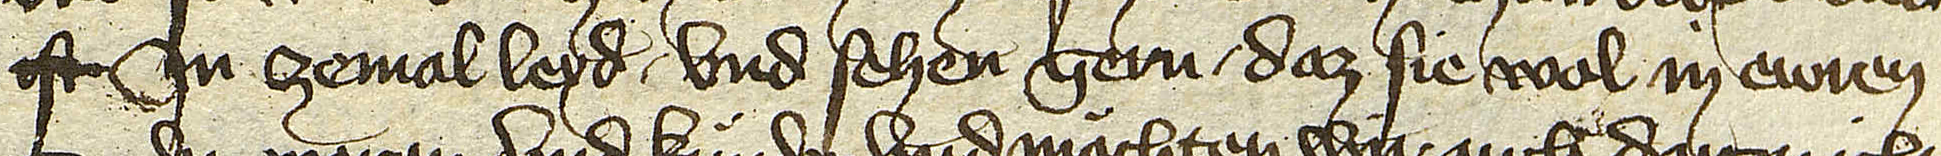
iſt In cʒemal leyd / vnd ſehen gern / daʒ ſie wol in ewren
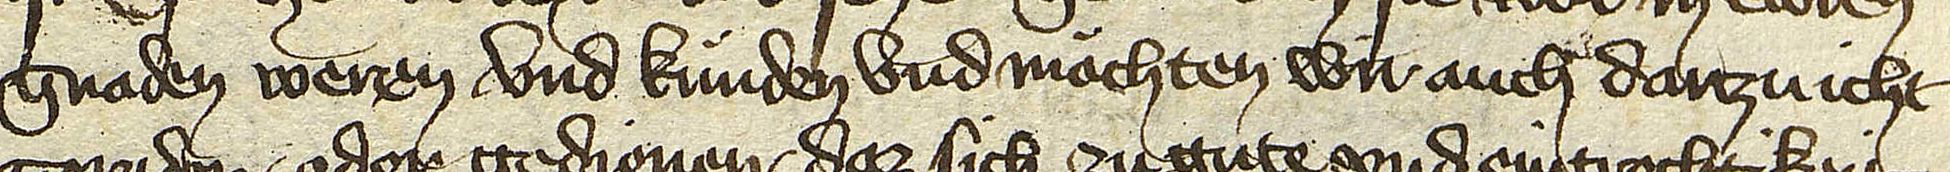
gnaden weren / vnd künden vnd möchten wir auch darcʒu icht
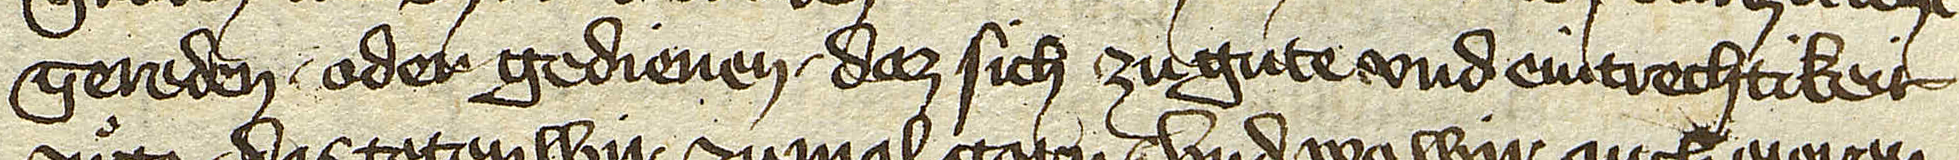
gereden / oder gedienen / daʒ ſich cʒu gute vnd eintrechtikeit
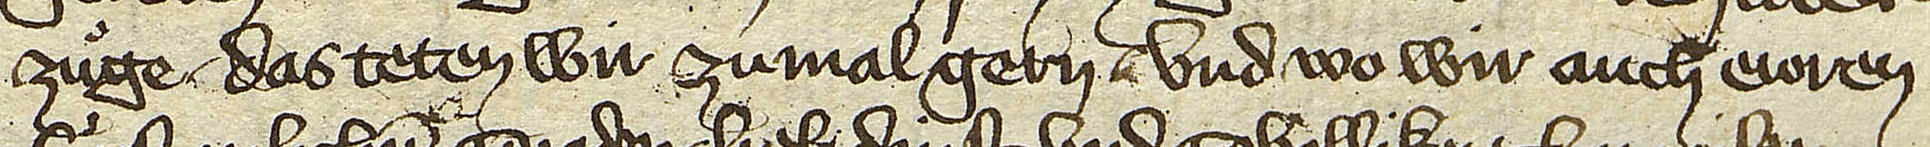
cʒüge / das teten wir cʒumal gern / vnd wo wir auch ewren
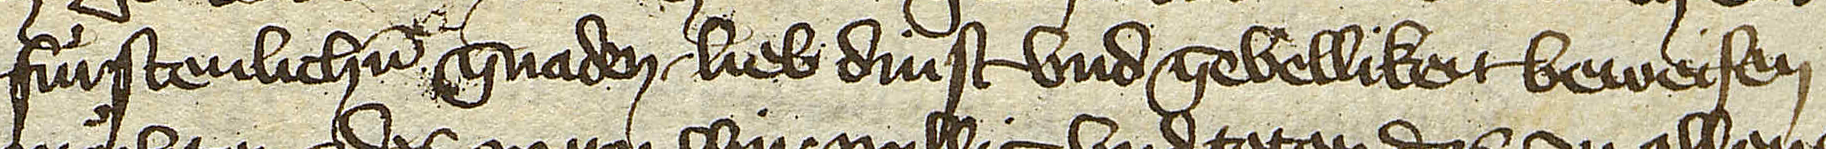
fürſtenlichn* gnaden / lieb dinſt vnd gevellikeit beweiſen
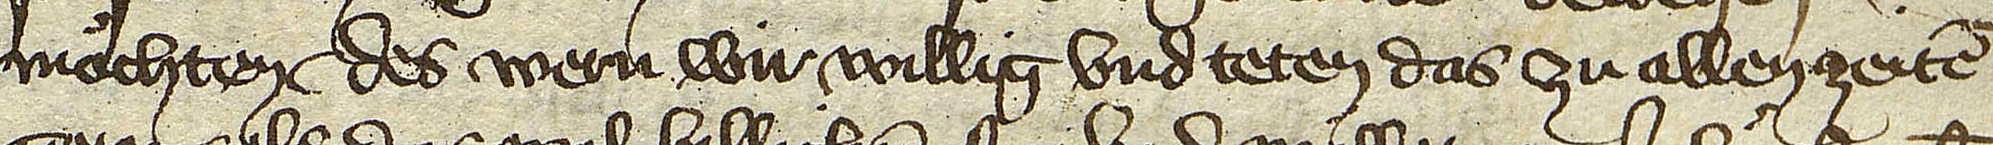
möchten / des wern wir willig vnd teten das cʒu allen cʒeite*
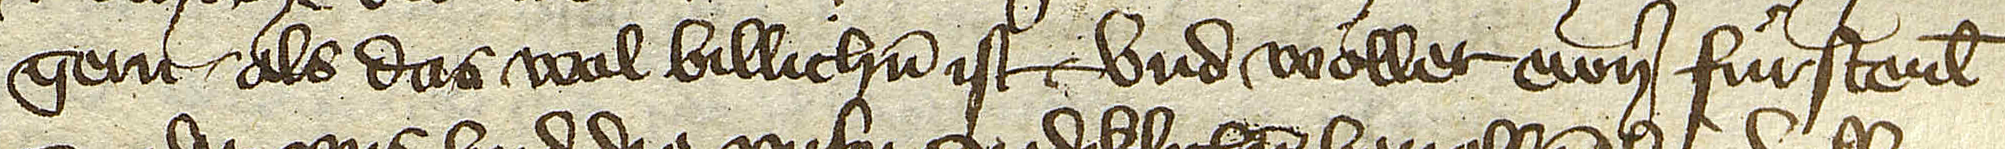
gern / als das wol billichn* iſt / vnd wöllet ewn* fürſtenl*
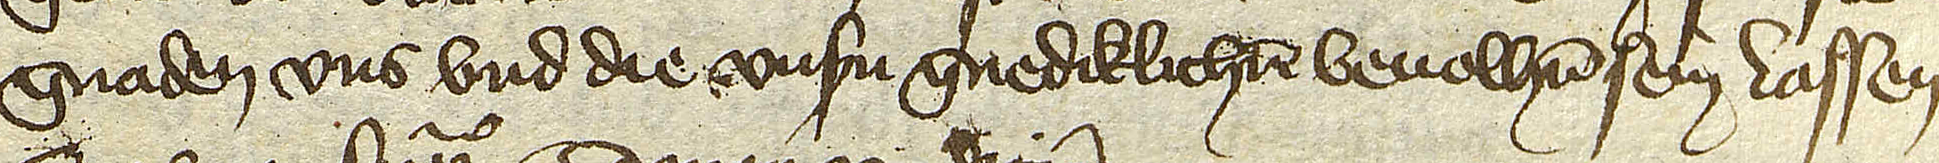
gnaden vns vnd die vnſ*n gnediklichn* beuolhn* ſein laſſen
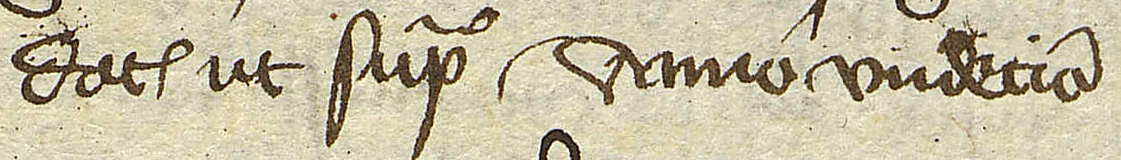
dat* ut ſup* / Anno vndecio*
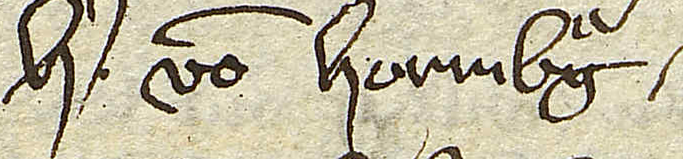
h* vo* hormb*g /
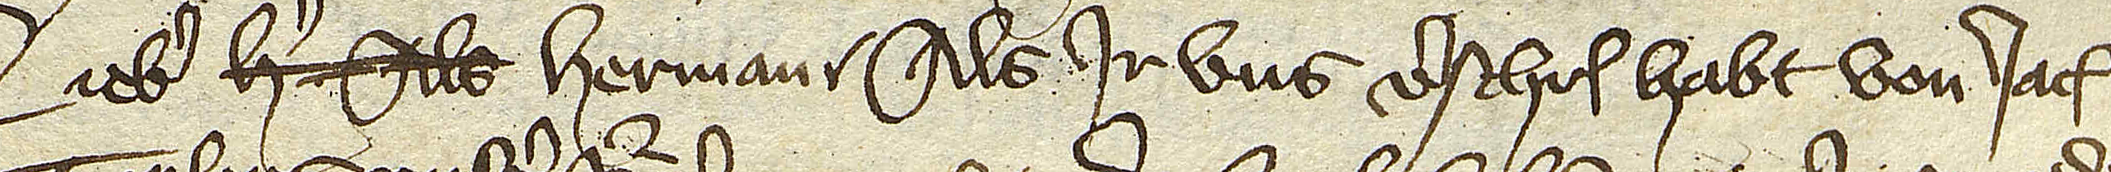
Lieb* h* Als herman / Als Ir vns v*ſchr* habt von Iac*
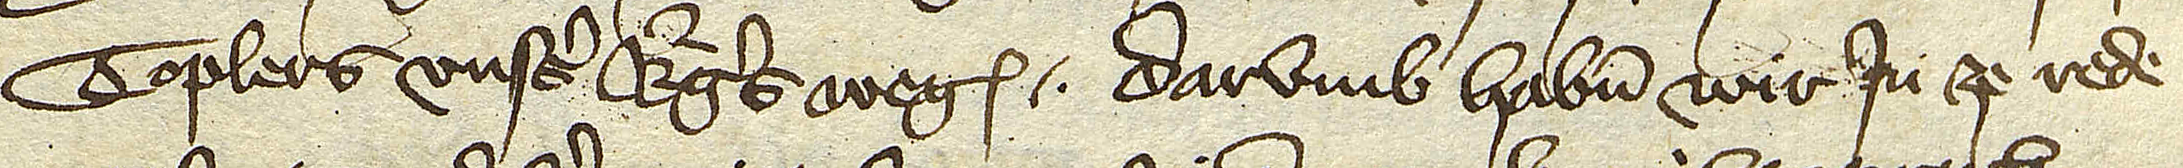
Toplers vnſs* B*g*s weg* / . Darvmb habn* wir In cʒe rede
